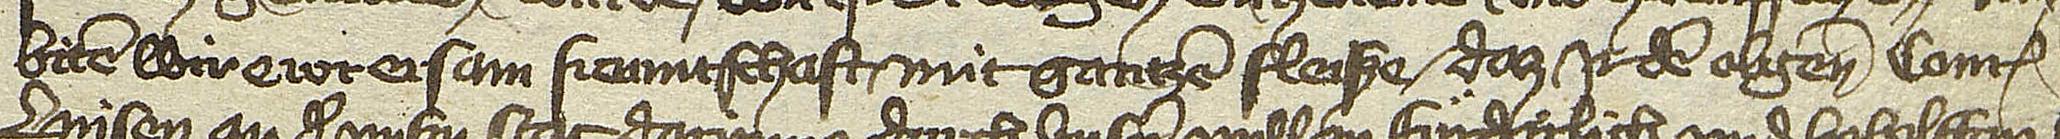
bite* wir ewr erſam freuntſchaft mit gancʒe fleiſʒe / daʒ Ir de* obgen* Conr*
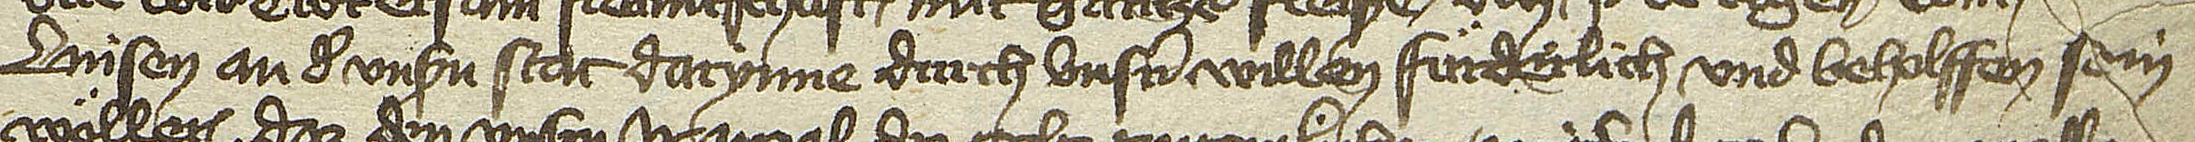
Linſen an d* vnſ*n ſtat darynne durch vnſn* willen fürderlich vnd beholffen ſein
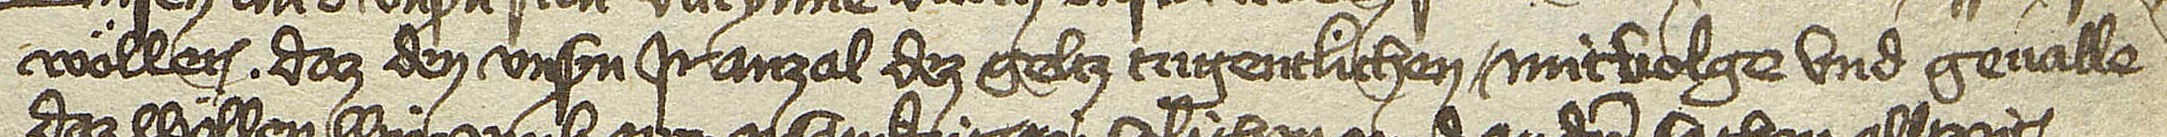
wöllet* . daʒ den vnſ*n Ir anʒal deʒ gelcʒ tugentlichen / mit*uolge vnd geualle
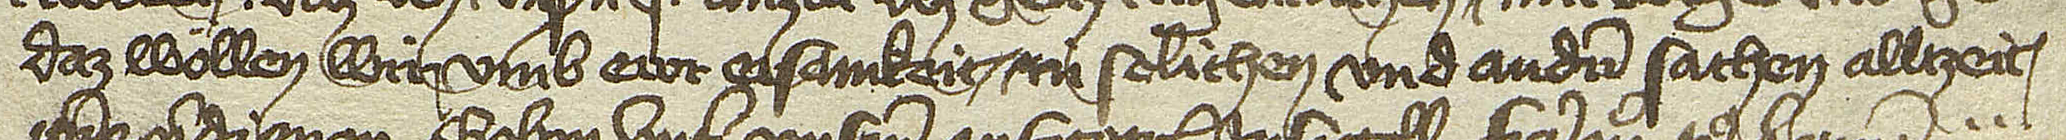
daʒ wöllen wir vmb ewr erſamkeit / mit ſolichen vnd andn* ſachen allcʒeit
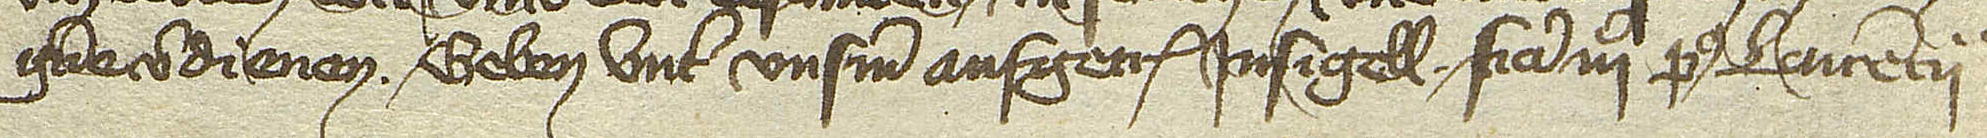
g*ne v*dienen . / Geben vnt* vnſm* aufgetr* Inſigell . / fia* iii* p* Laurecii*
